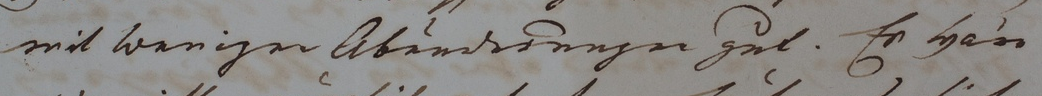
mit wenigen Abänderungen gut. Es wäre
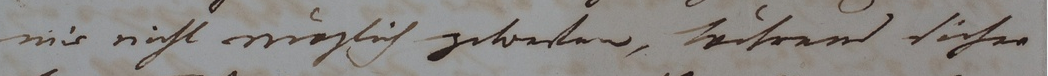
mir nicht möglich gewesen, während dieser
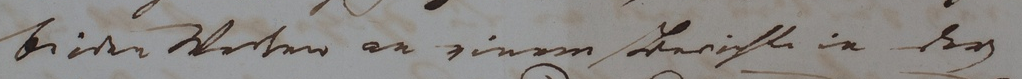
beiden Wochen an einem Berichte in der
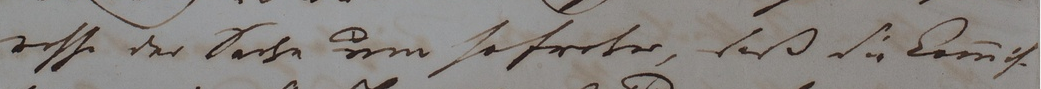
resse der Sache um so froher, daß die Commis-
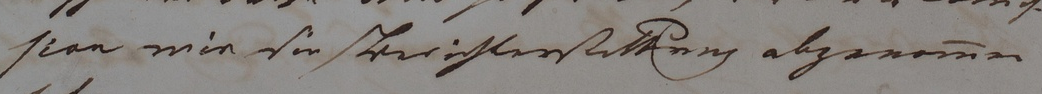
sion mir die Berichterstattung abgenommen
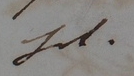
hat.
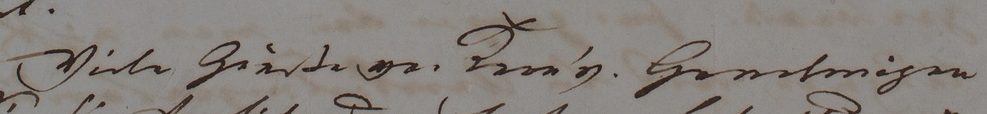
Viele Grüße von Kern's. Genehmigen
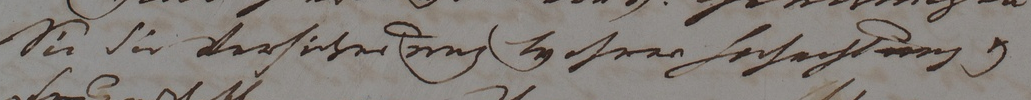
Sie die Versicherung wahrer Hochachtung &
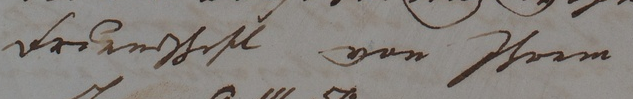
Freundschaft von Ihrem
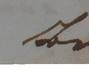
Bern.
